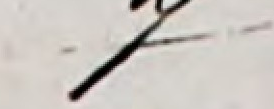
7
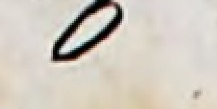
6
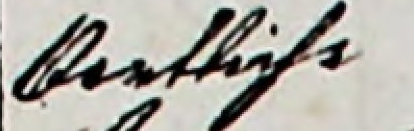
Vertliche
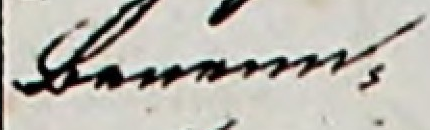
Benenn„
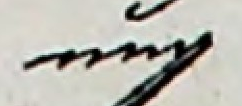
ung
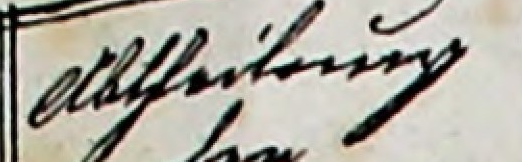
Abtheilung
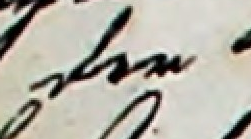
der
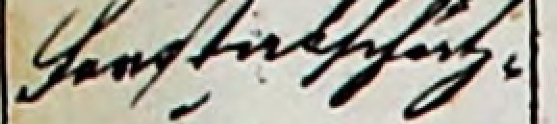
Forstabschätz„
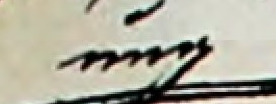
ung
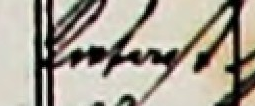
Katast
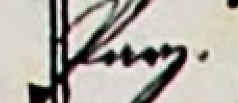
Parz.
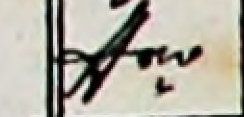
ffer
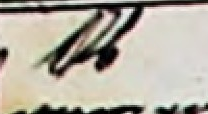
Ab
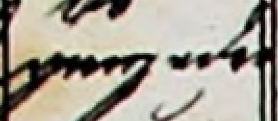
ganz oder
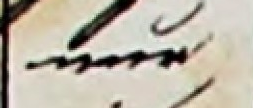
nur
